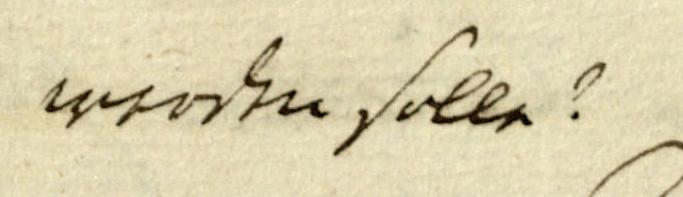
werden solle?
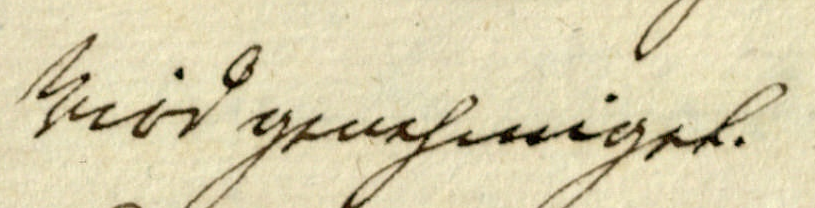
Wird genehmiget.
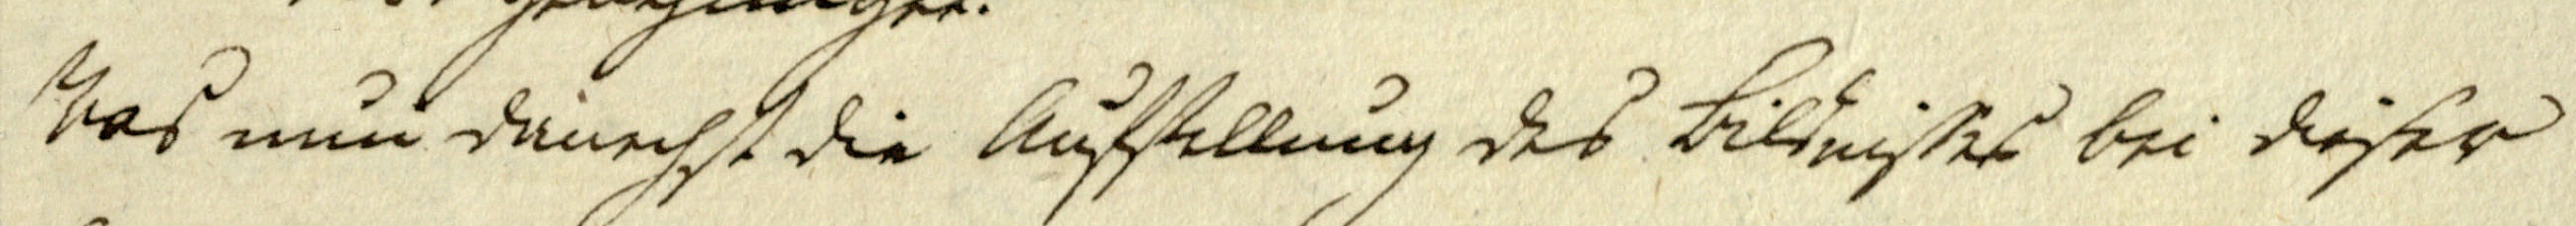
was nun danechst die Aufstellung des Bildnisses bei dieser
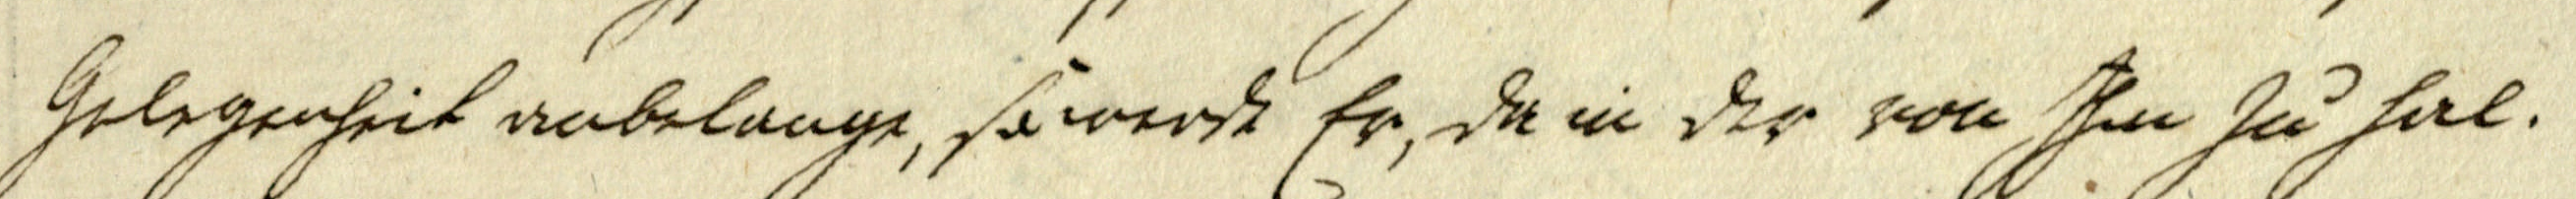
Gelegenheit anbelange, so werde Er, da in der von Ihm zu hal¬
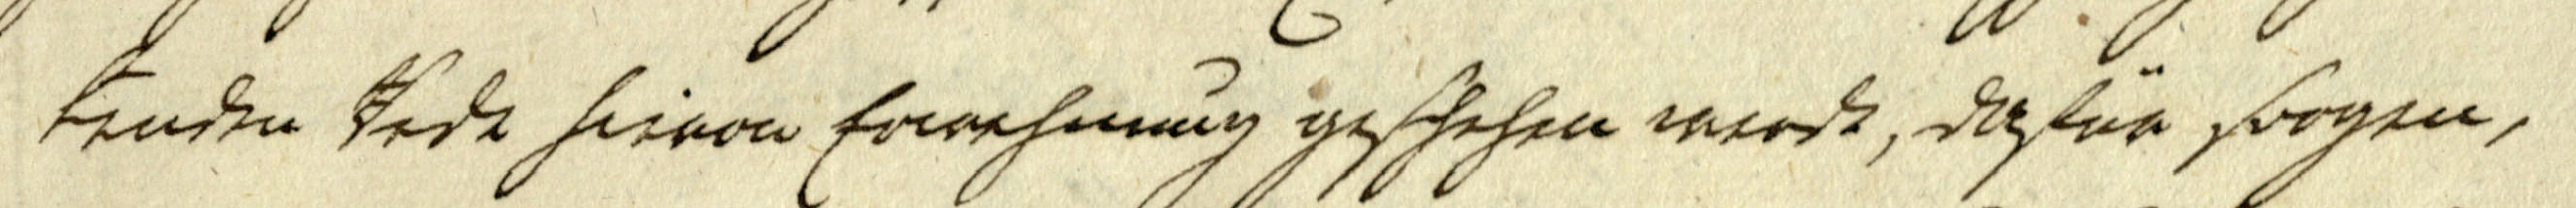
tenden Rede hievon Erwehnung geschehen werde, dafür sorgen,
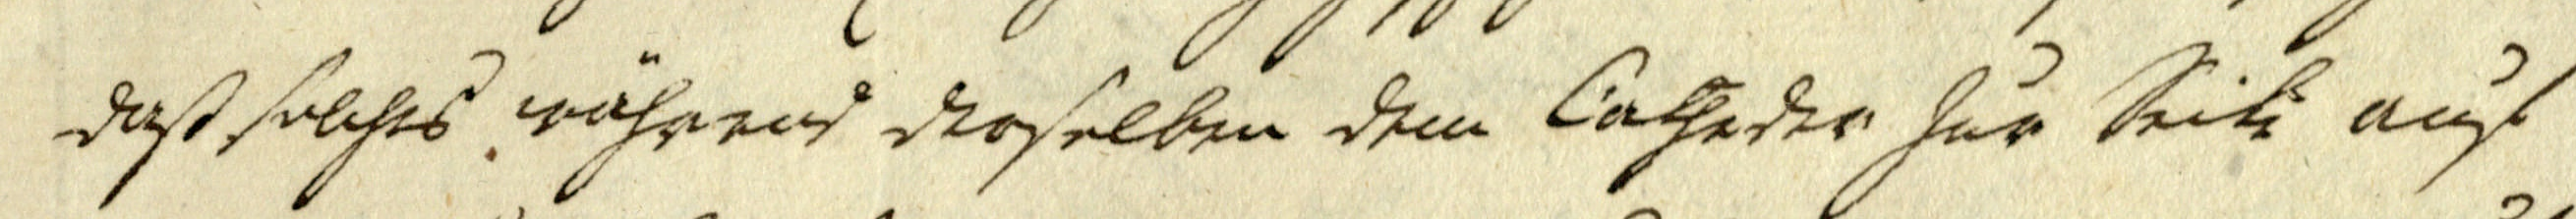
daß solches während derselben dem Catheder zur Seite auf
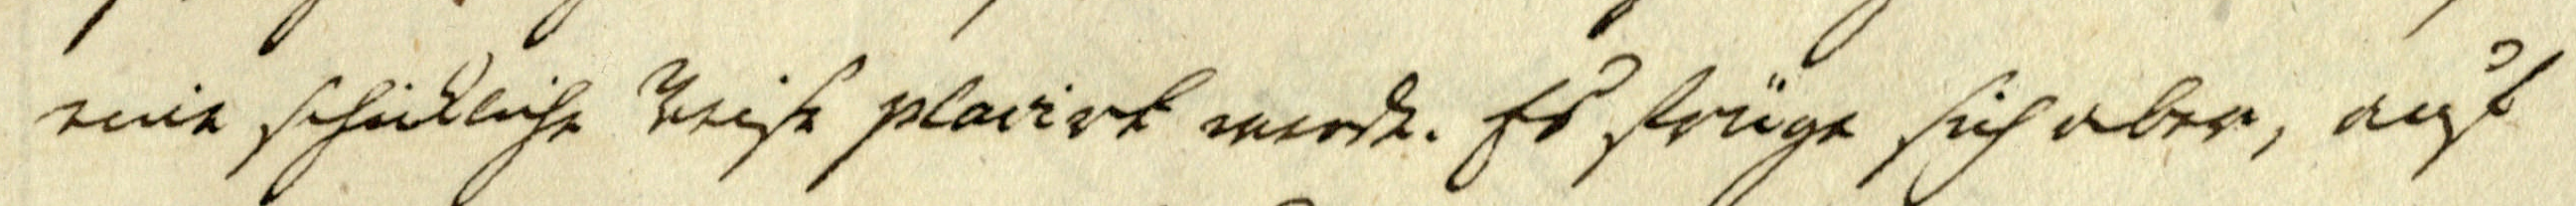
eine schickliche Weise placirt werde. Es früge sich aber, auf
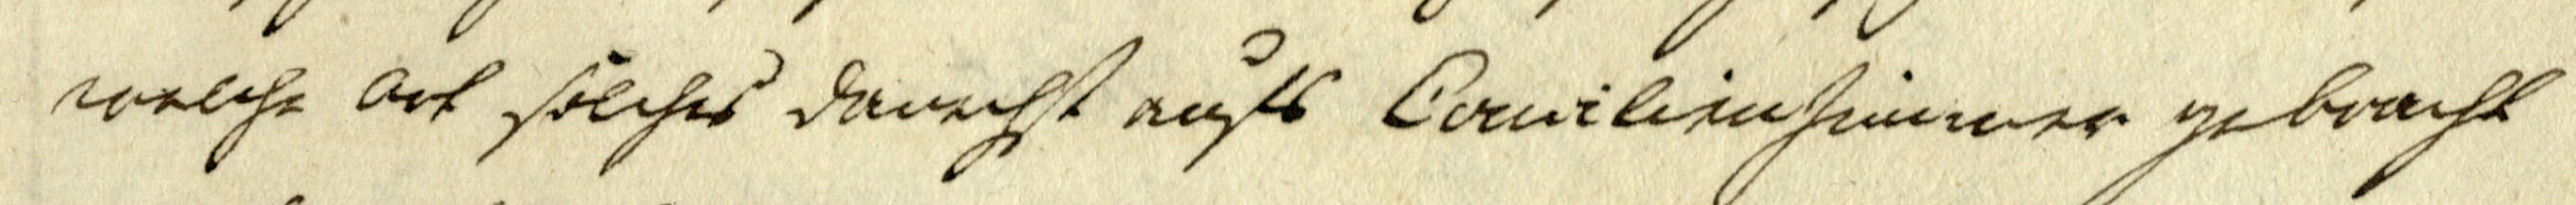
welche Art solches danechst aufs Concilienzimmer gebracht
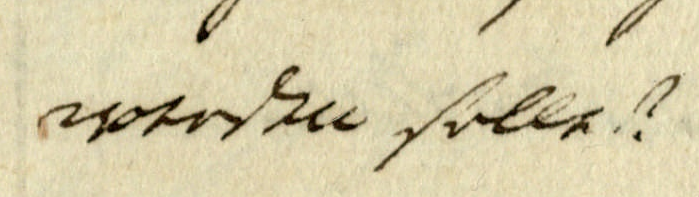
werden solle?
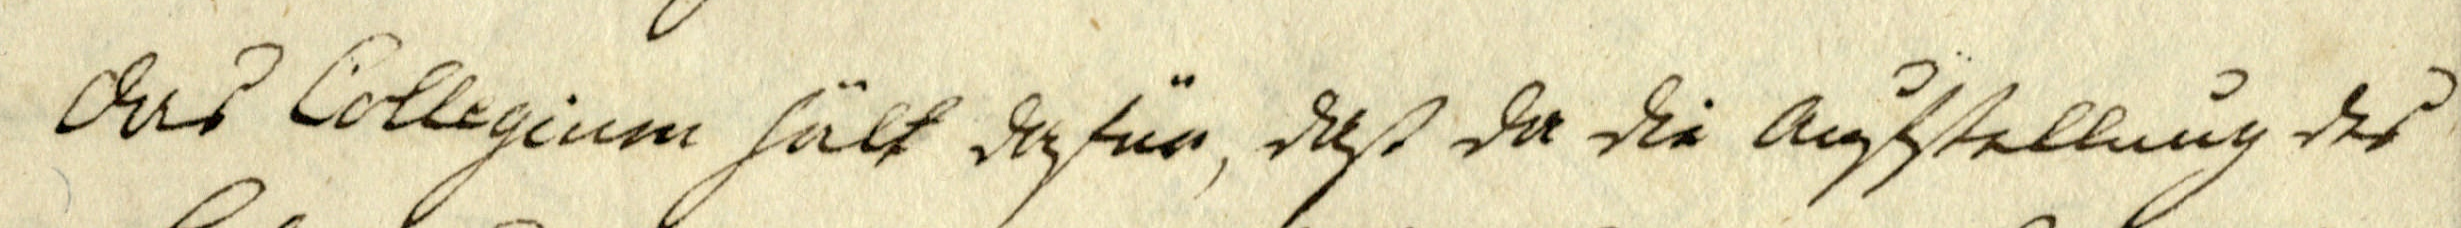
Das Collegium hält dafür, daß da die Austellung des
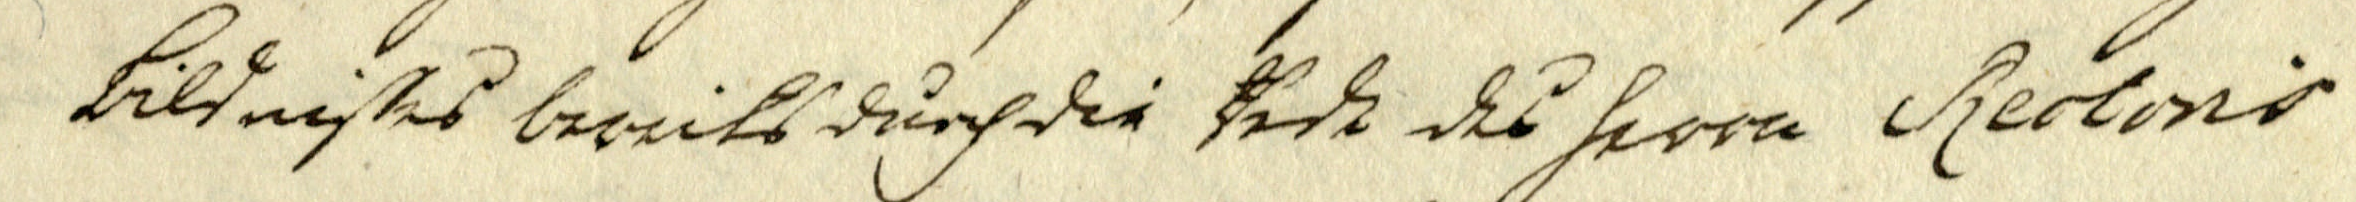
Bildnisses bereits durch die Rede des herrn Rectoris
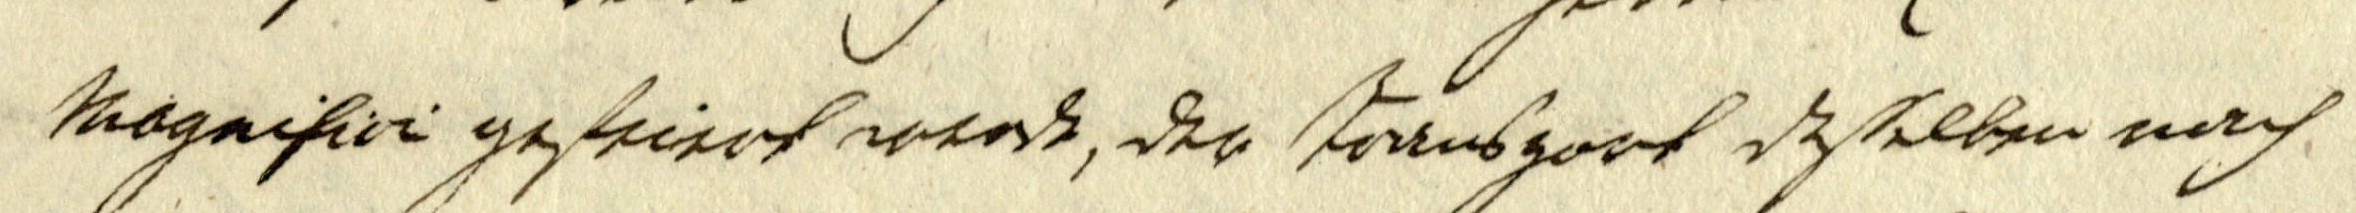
Magnifici gefeiert werde, der Transport desselben nach
